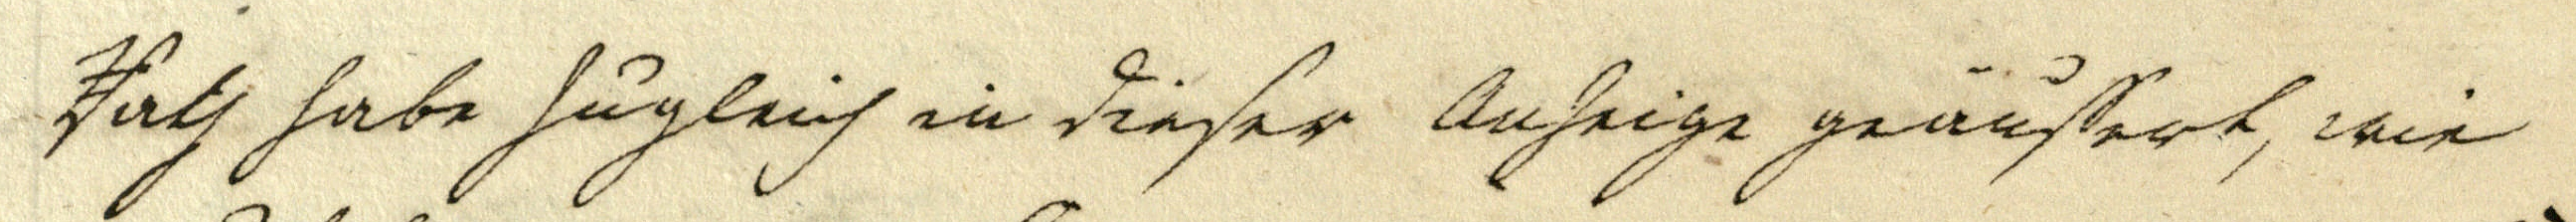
Rath habe zugleich in dieser Anzeige geäussert, wie
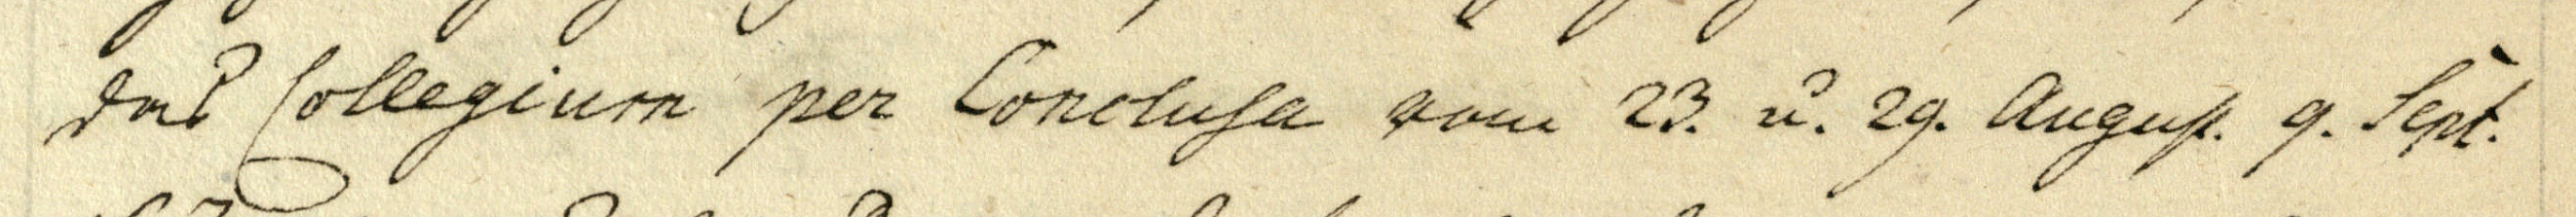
das Collegium per Conclusa vom 23. und 29. August 9. Sept.
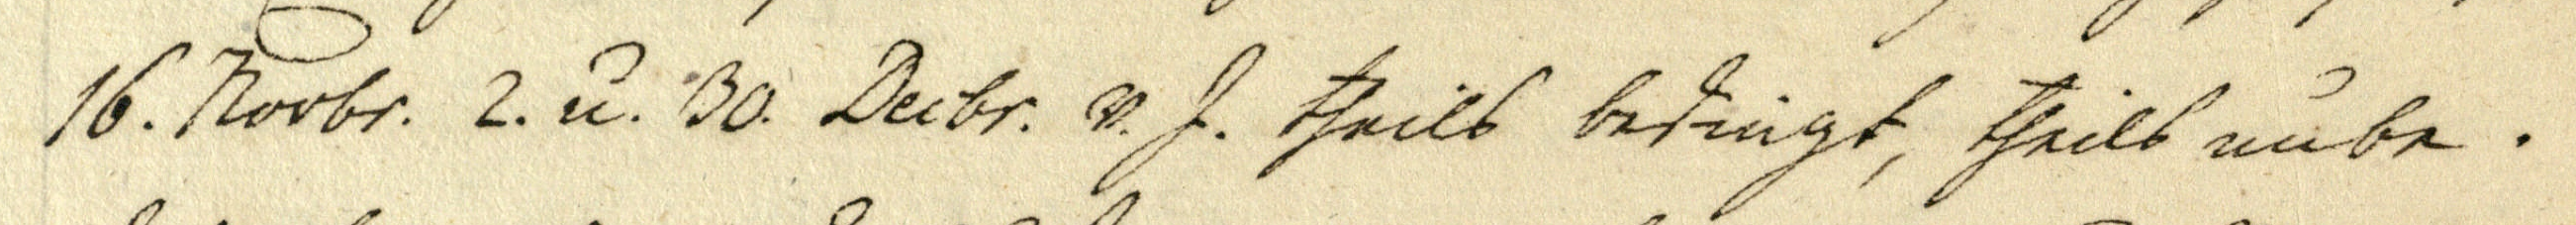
16. Novbr. 2. und 30. Decbr. v. J. theils bedingt, theils unbe¬
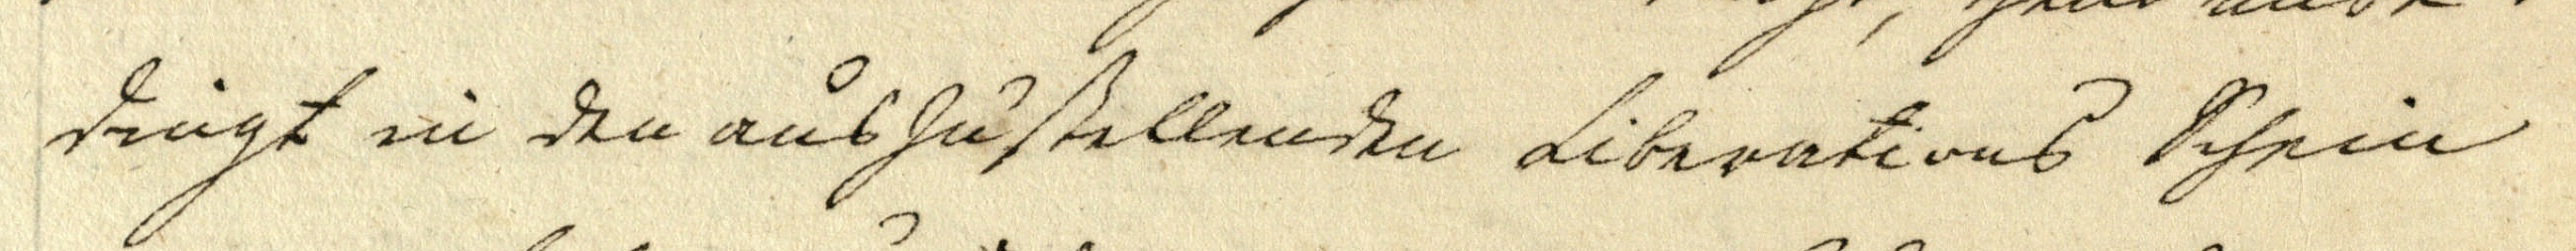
dingt in den auszustellenden Liberations Schein
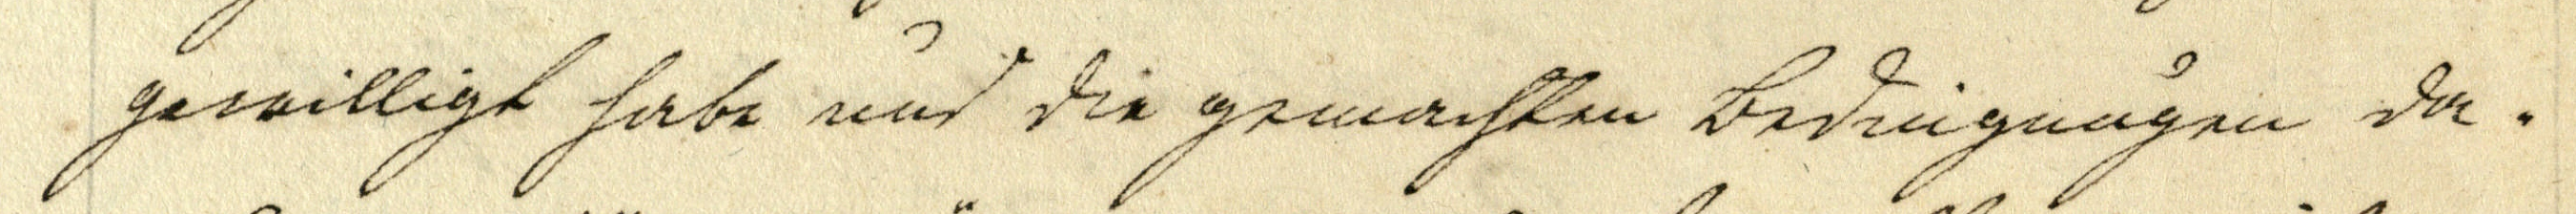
gewilligt habe und die gemachten Bedingungen da¬
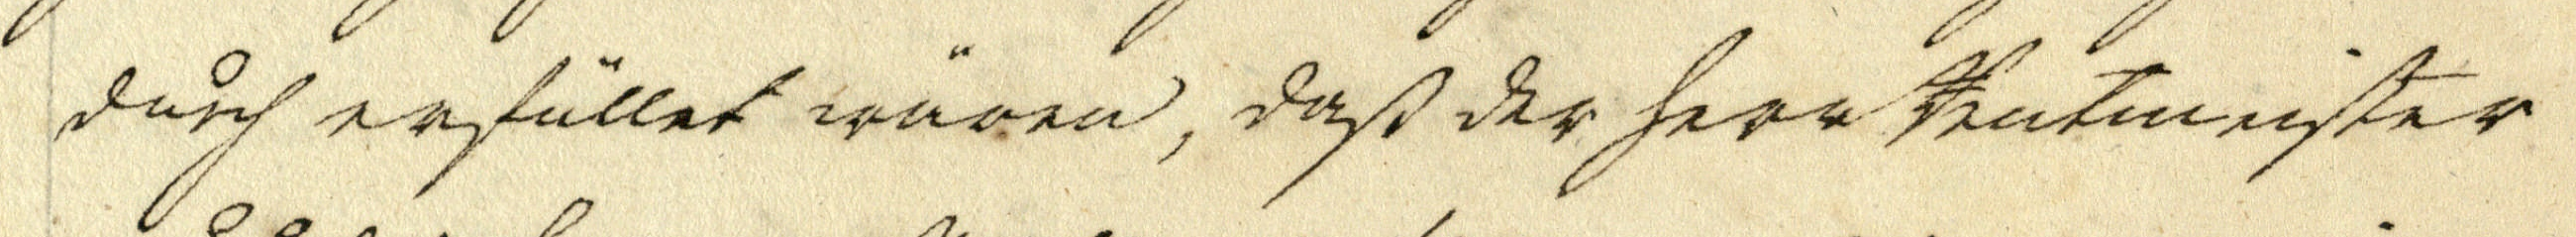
durch erfüllet wären, daß der herr Rentmeister
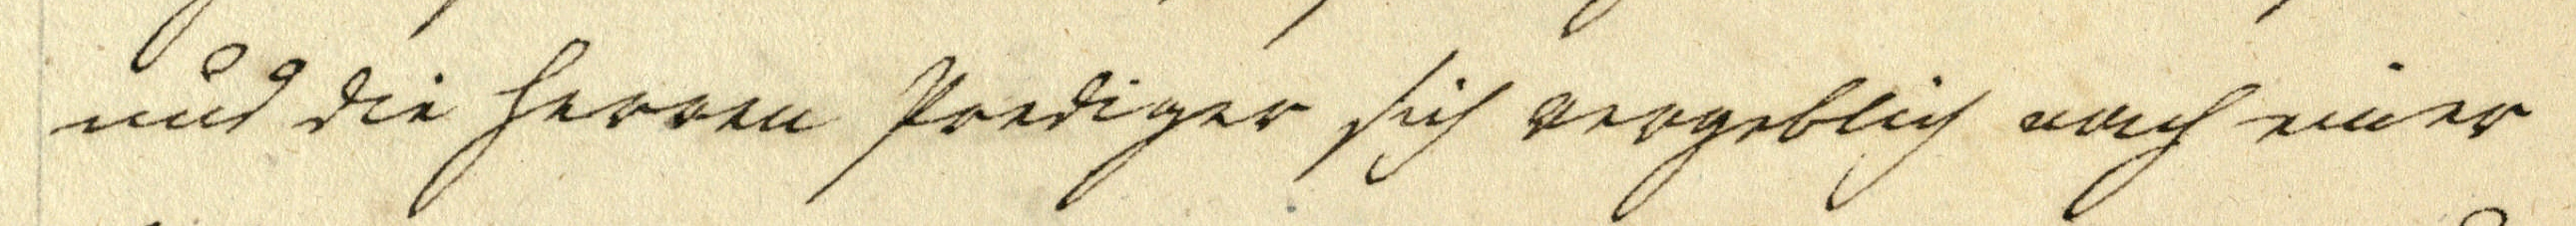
und die herren Prediger sich vergeblich nach einer
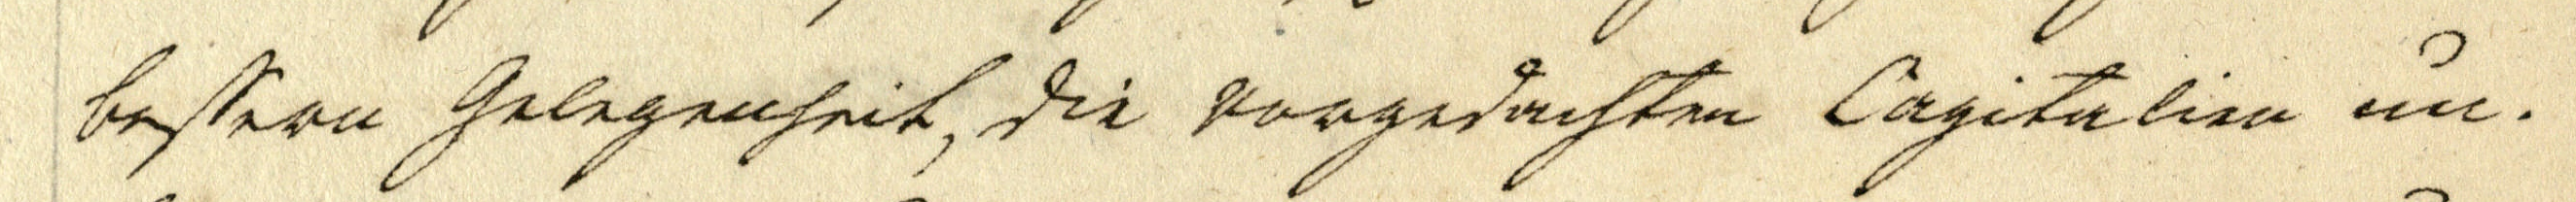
bessern Gelegenheit, die vorgedachten Capitalien un¬
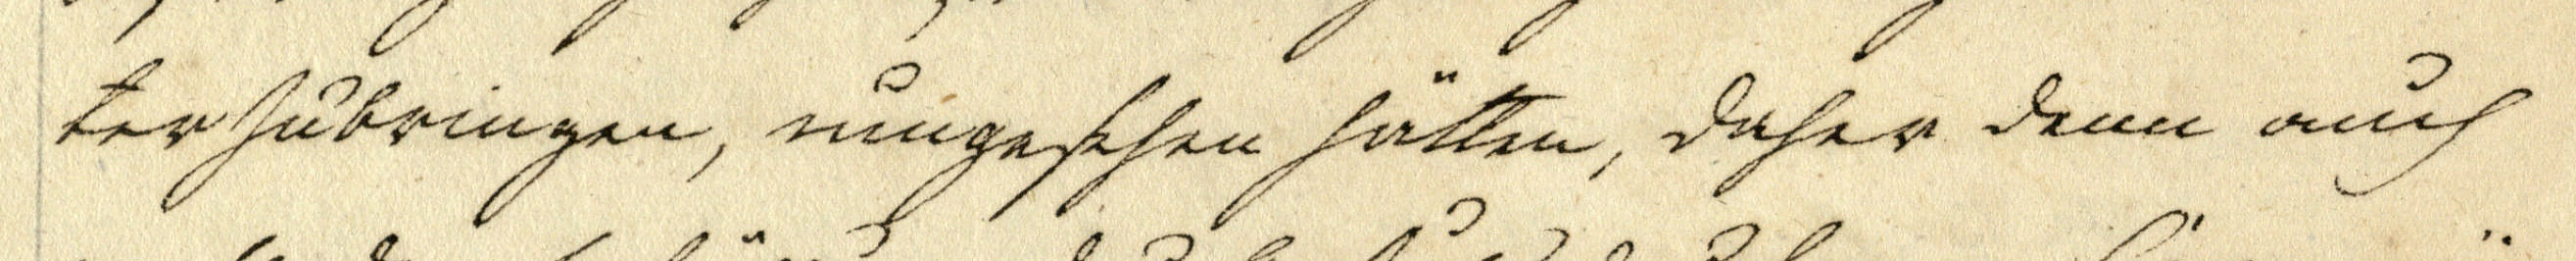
terzubringen, umgesehen hätten, daher denn auch
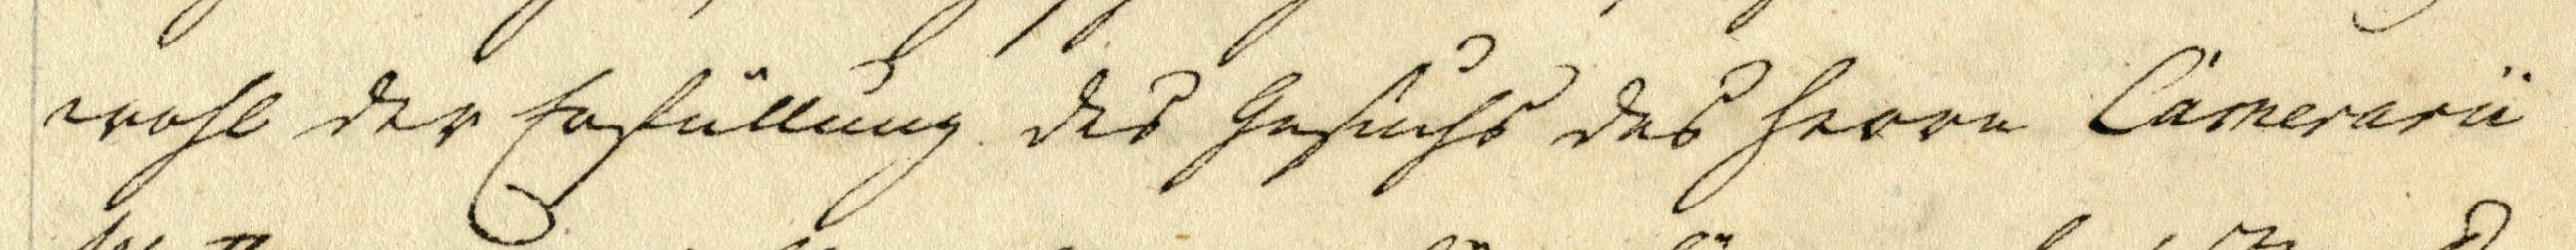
wohl der Erfüllung des Gesuchs des herrn Camerarii
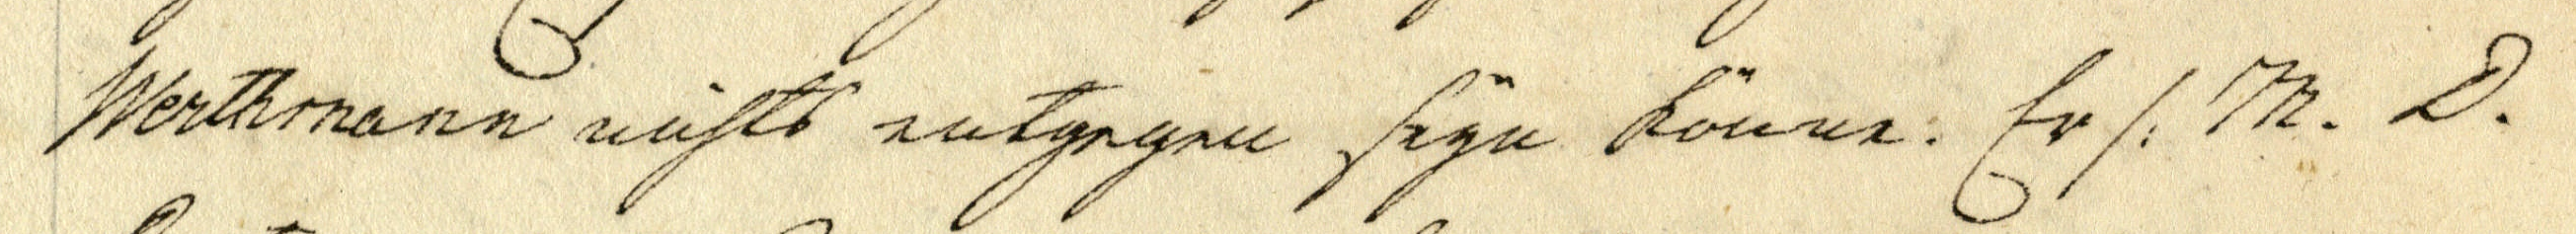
Werthmann nichts entgegen sein könne. Er / M. D.
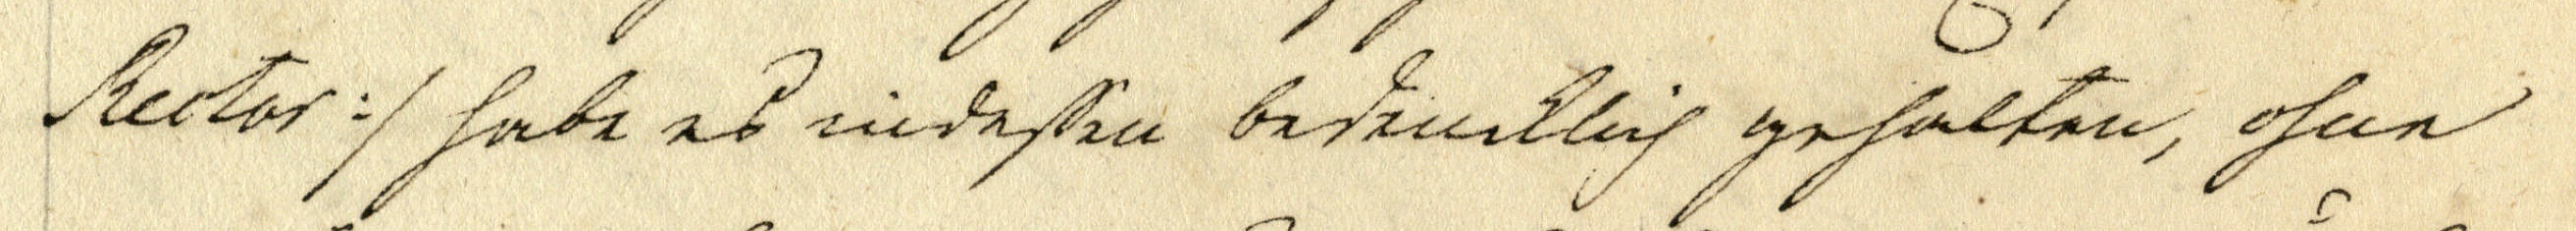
Rector / habe es indessen bedencklich gehalten, ohne
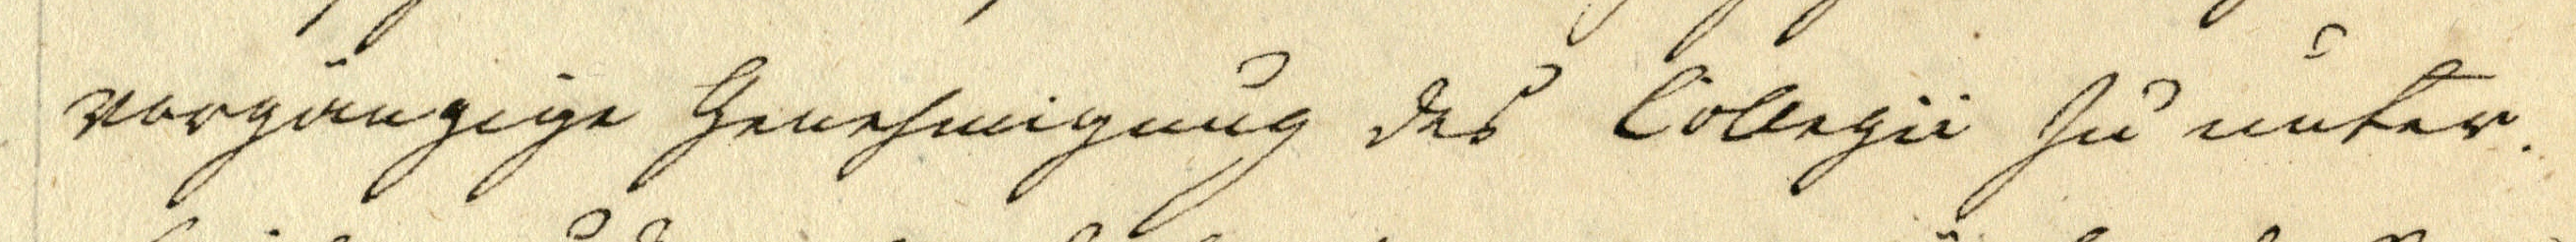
vorgängige Genehmigung des Collegii zu unter¬
